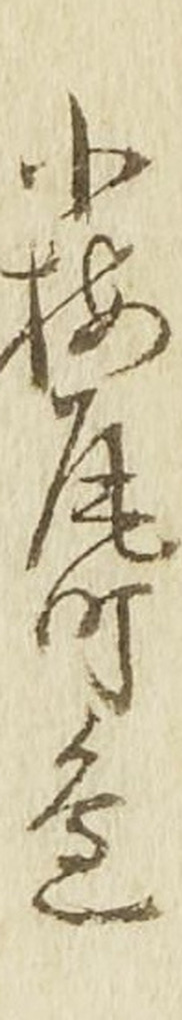小梅瓦町辺
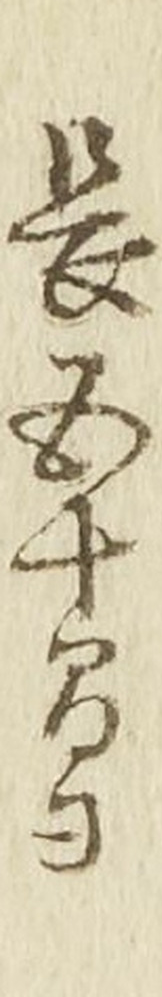長五十間ヨ
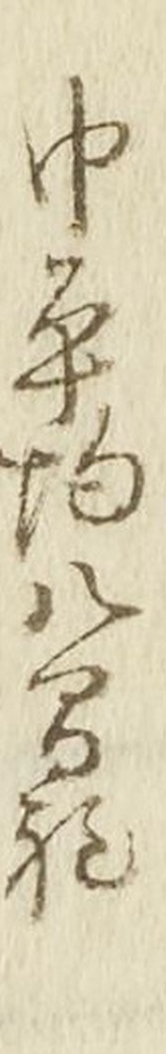巾平均八間程

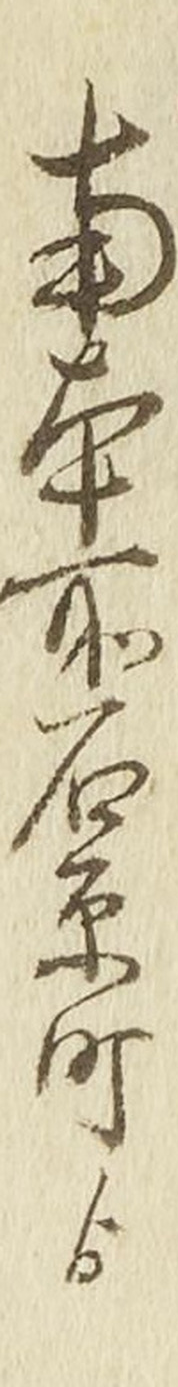南本所石原町ゟ
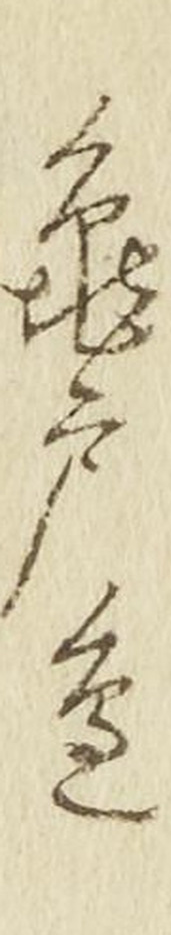亀戸辺

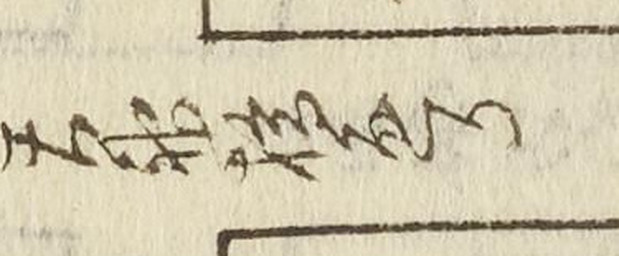天神橋通り

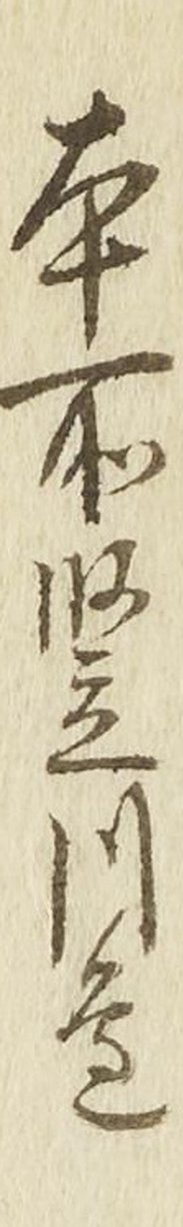本所竪川辺
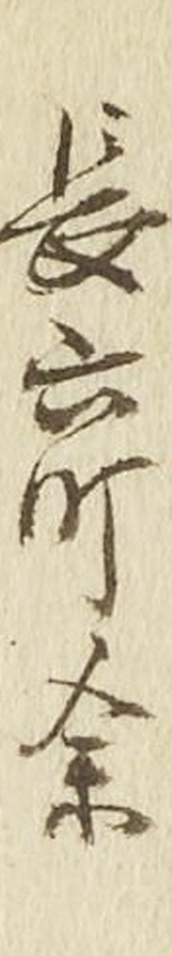長六町余
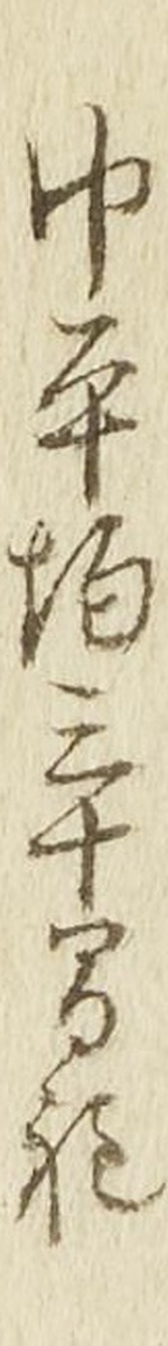巾平均三十間程

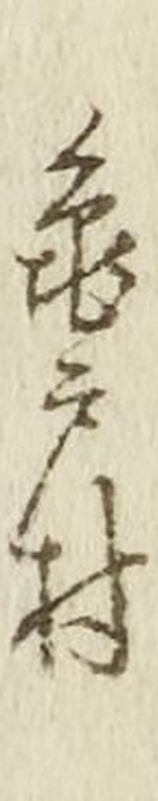亀戸村

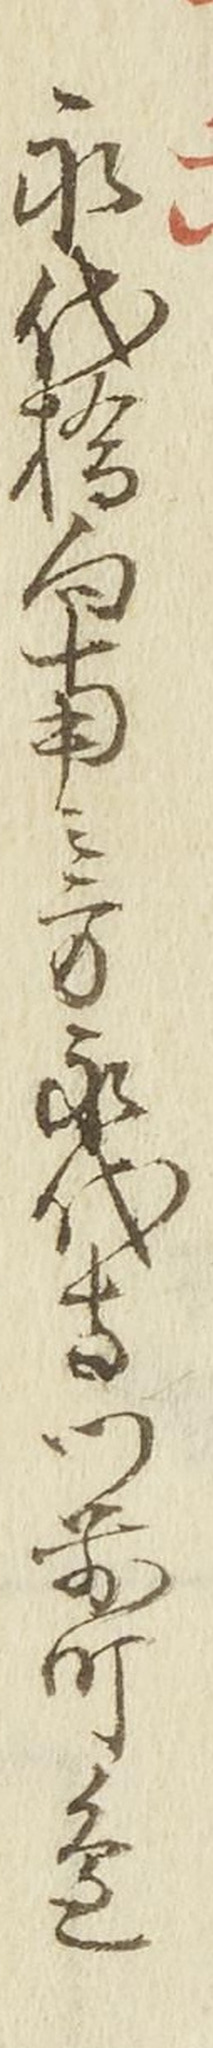永代橋向南之方永代寺門前町辺

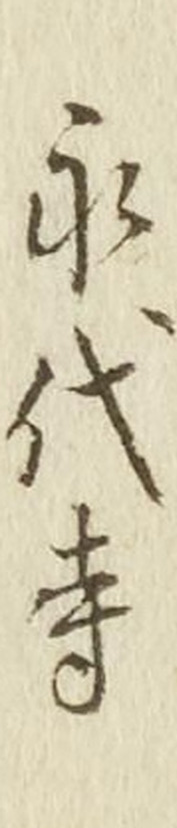永代寺
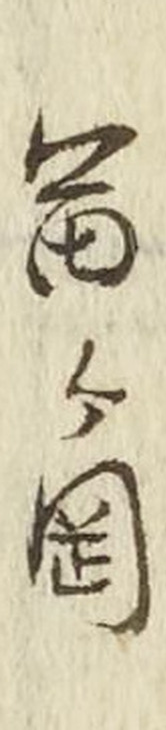冨ケ岡

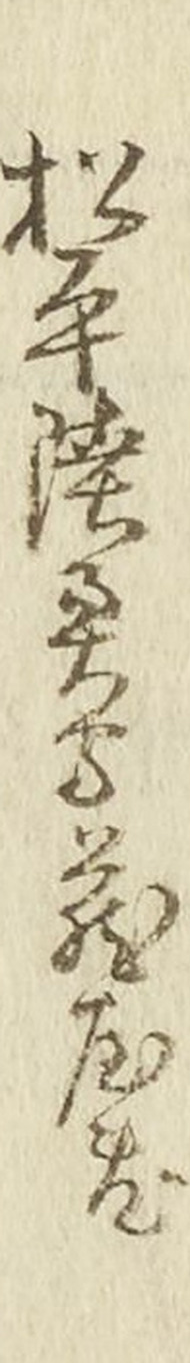十七松平陸奥守蔵屋敷
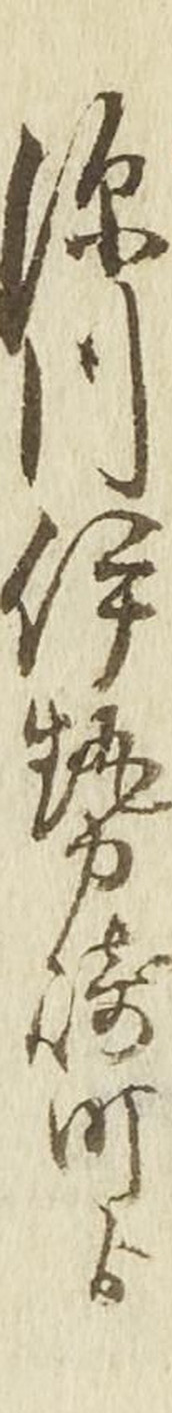深川伊勢崎町
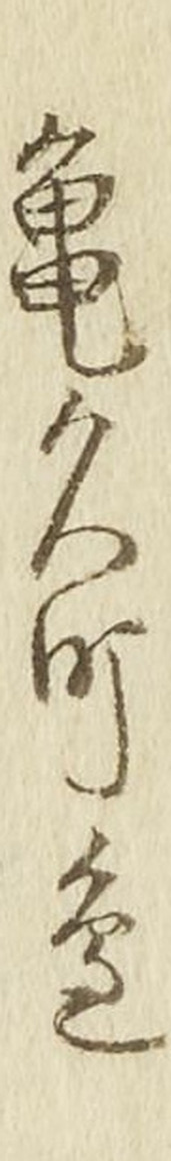亀久町辺
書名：安政二年震災記事　完
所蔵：東京大学地震研究所図書室 Earthquake Research Institute Library, The University of Tokyo, JAPAN
